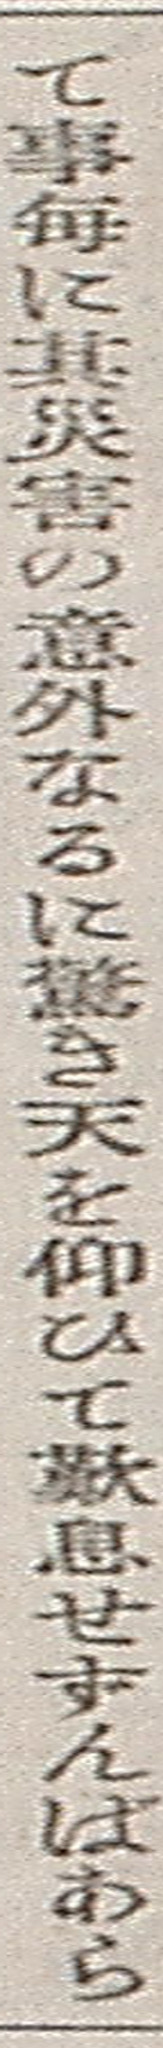て事毎に其災害の意外なるに驚き天を仰ひて歎息せずんばあら
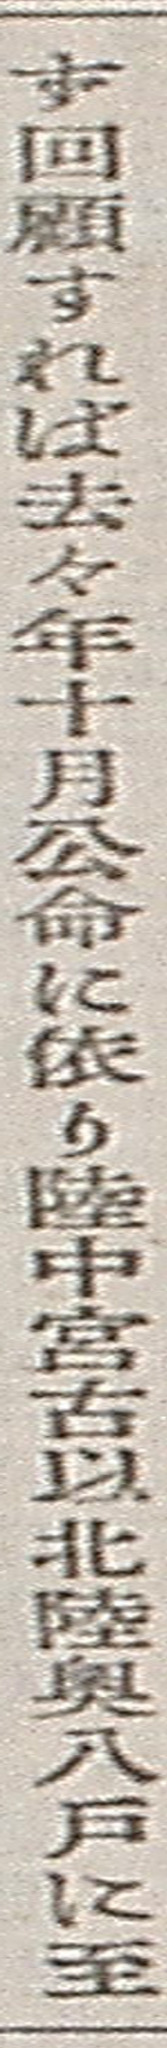ず回顧すれば去々年十月公命に依り陸中宮古以北陸奥八戸に至
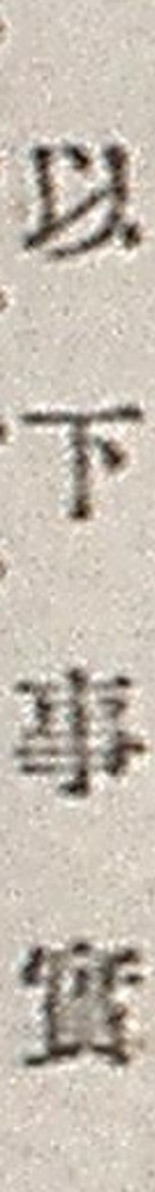以下事実
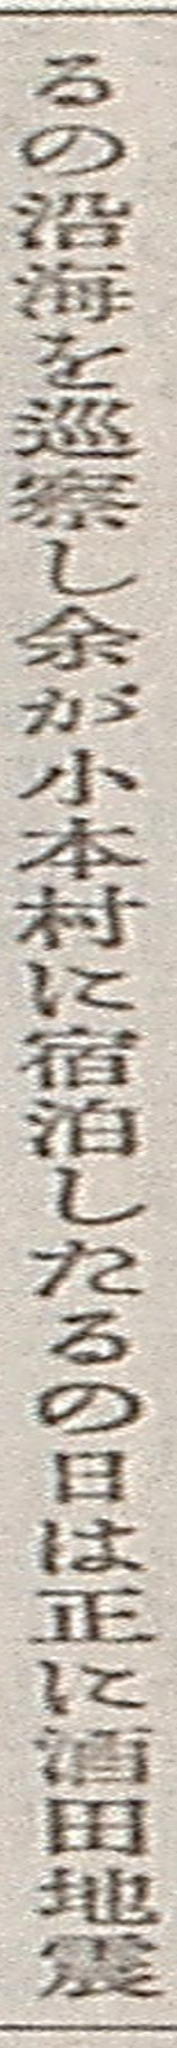るの沿海を巡察し余が小本村に宿泊したるの日は正に酒田地震
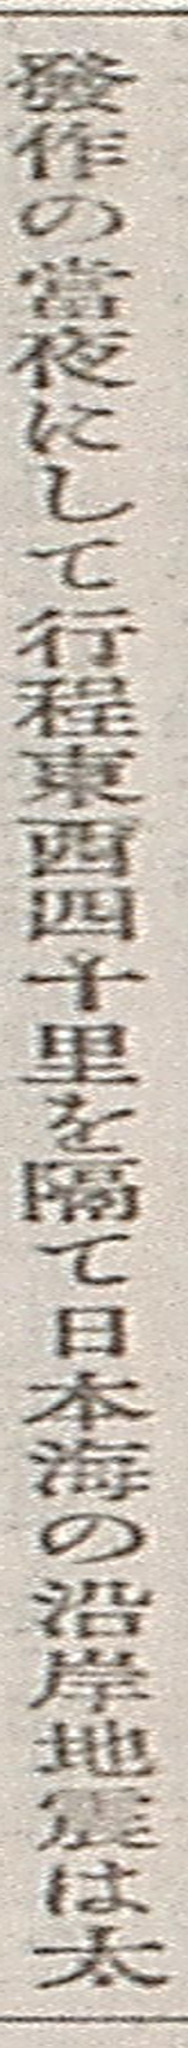発作の当夜にして行程東西四十里を隔て日本海の沿海地震は太
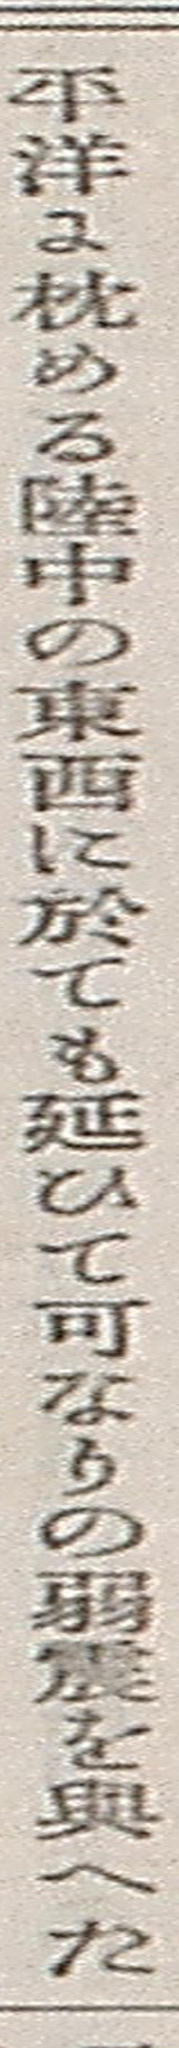平洋に沈める陸中の東西に於ても延ひて可なりの弱震を与へた
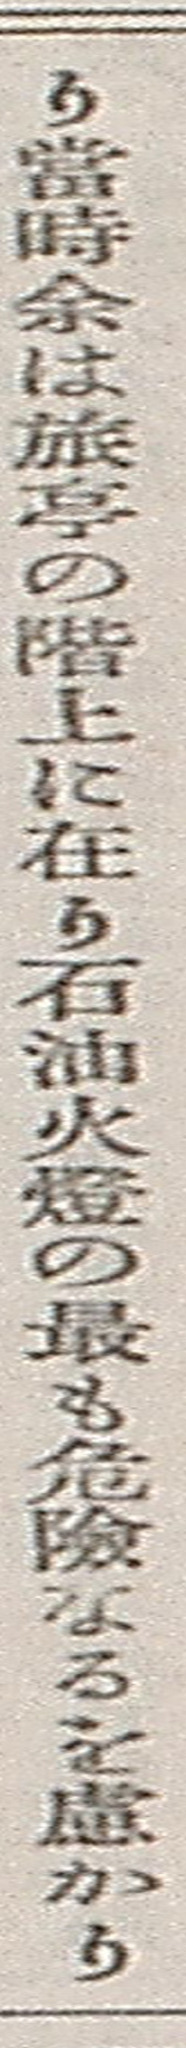り当時余は旅亭の階上に在り石油火燈の最も危険なるを慮かり
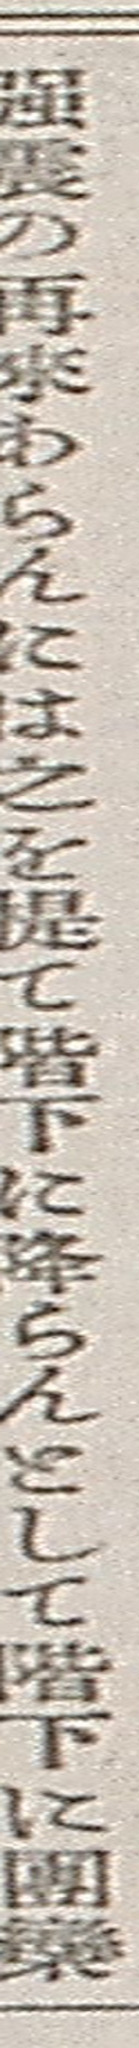弱震の再来あらんには之を堤て階下に降らんとして階下に団欒
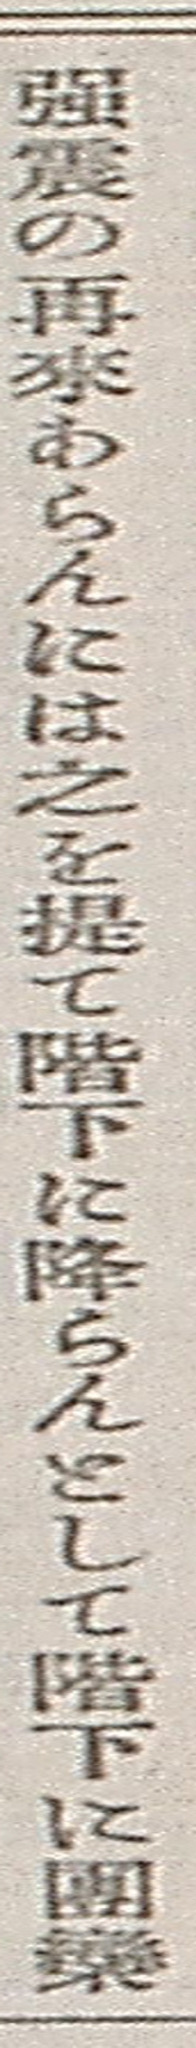弱震の再来あらんには之を堤て階下に降らんとして階下に団欒
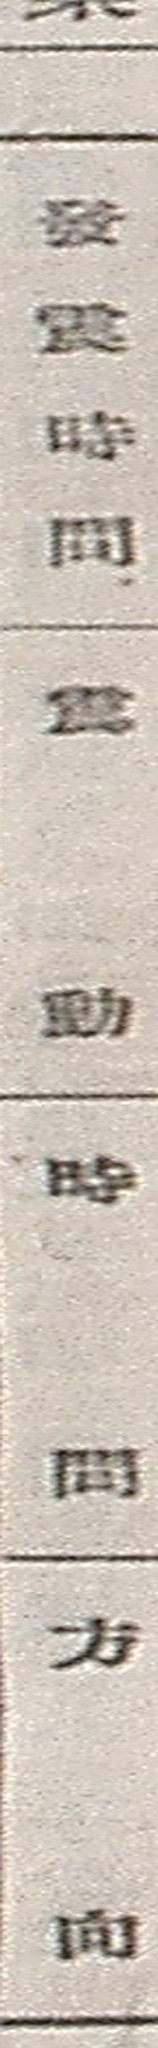発震時間震動時間方向
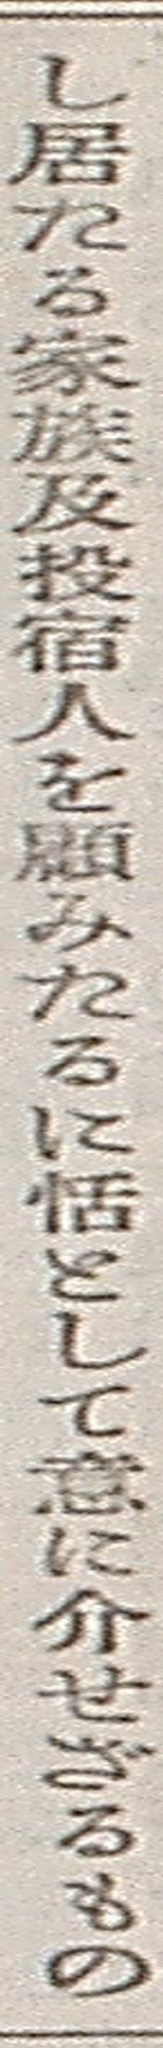し居たる家族及投宿人を顧みたるに恬として意に介せざるもの
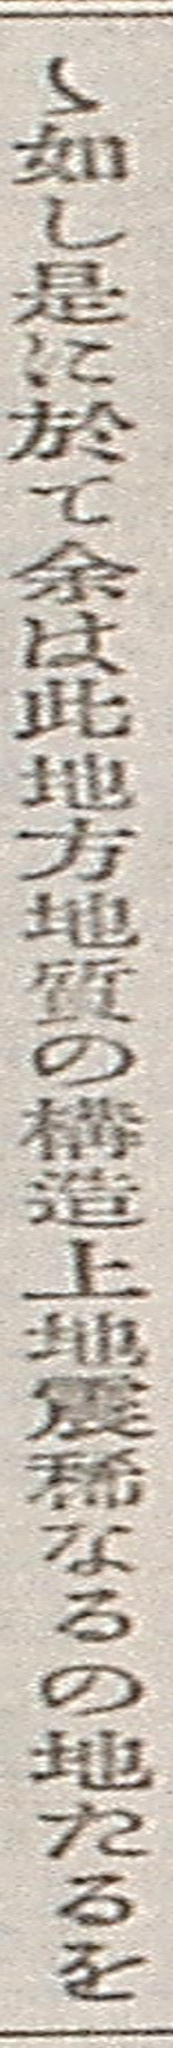ゝ如し是に於て余は此地方地質の構造上地震稀なるの地たるを
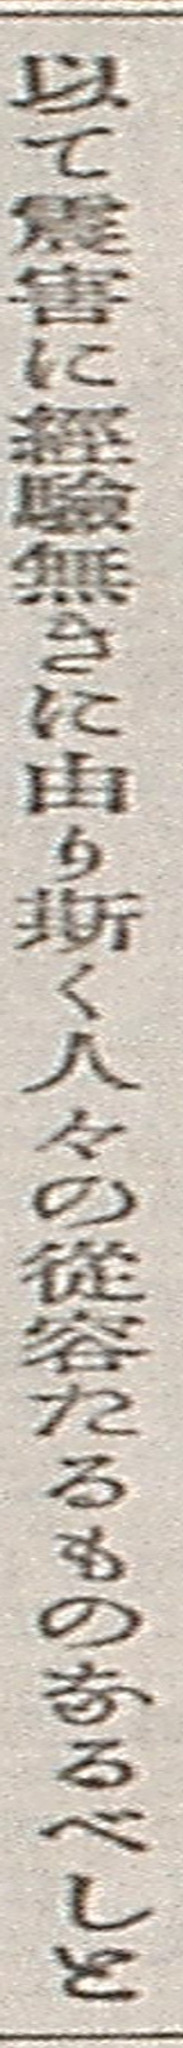以て震害に経験無きに由り斯く人々の従容たるものなるべしと
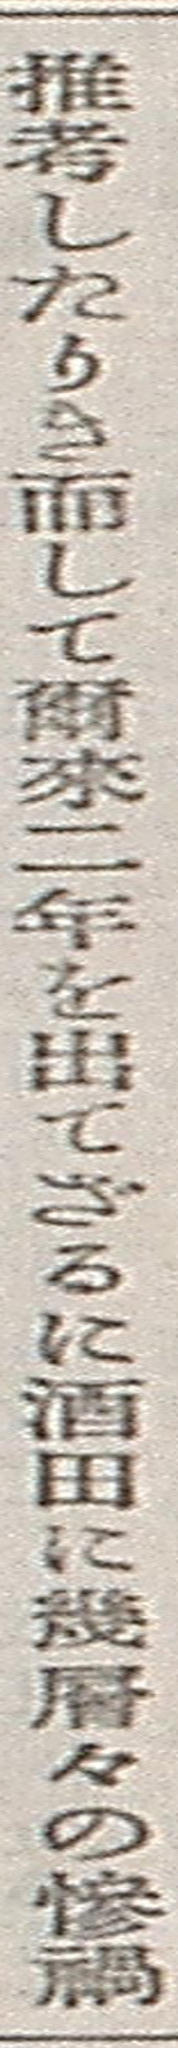推考したりき而して爾来二年を出てざるに酒田に幾層々の惨禍
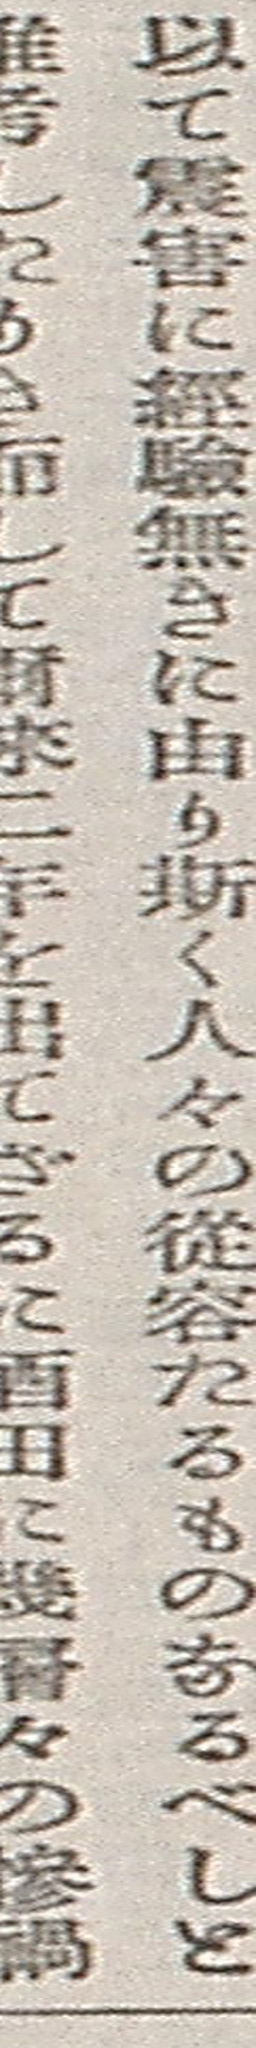推考したりき而して爾来二年を出てざるに酒田に幾層々の惨禍
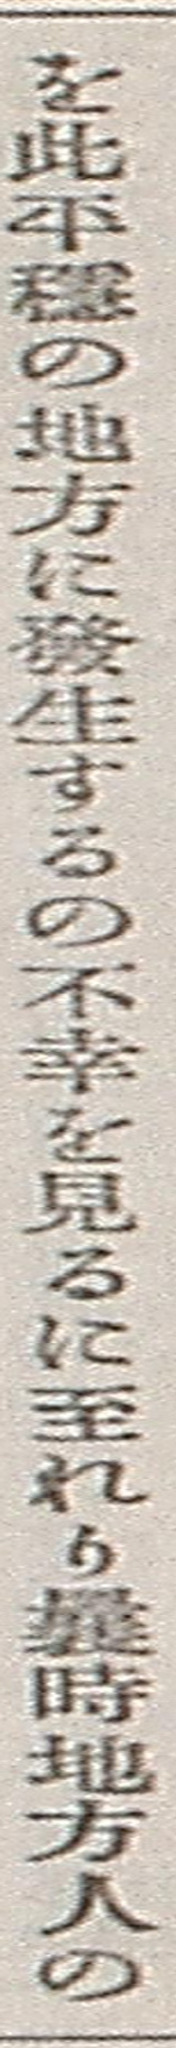を此平穏の地方に発生するの不幸を見るに至れり曩時地方人の
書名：風俗畫報臨時増刊第百十九號　大海嘯被害録（中）
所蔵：東京大学地震研究所図書室 Earthquake Research Institute Library, The University of Tokyo, JAPAN
